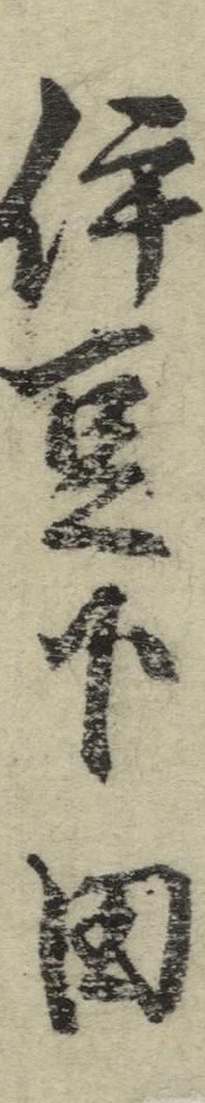伊豆下田
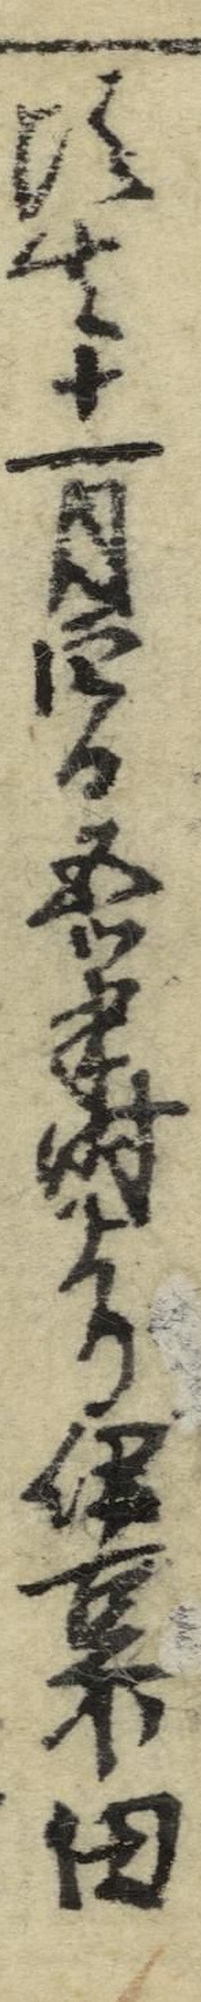頃は十一月四日五ッ半時より伊豆下田
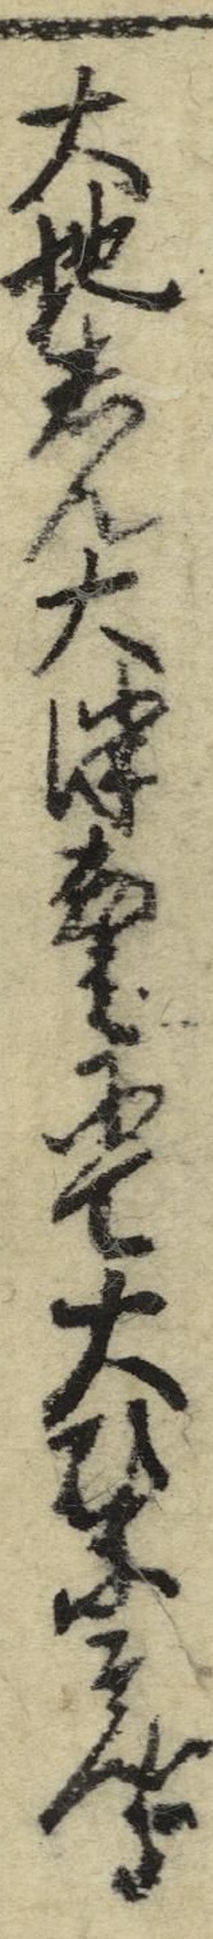大地しん大津なみにて大ひにそんじる
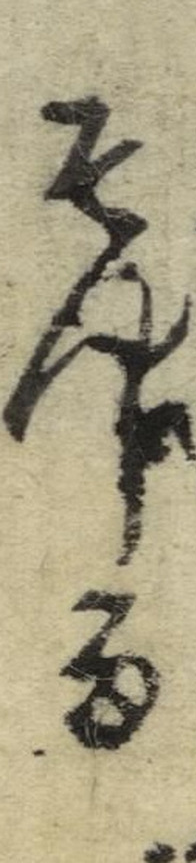そんじる
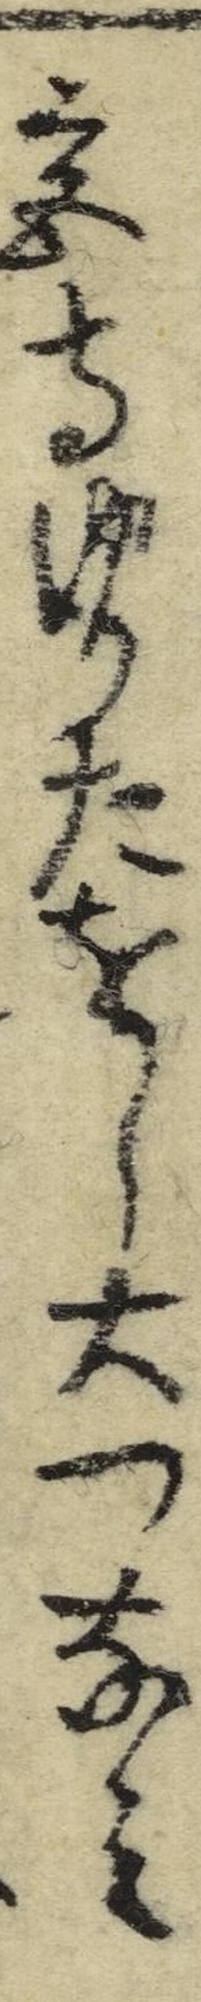宮寺ゆりたをし大つなみ
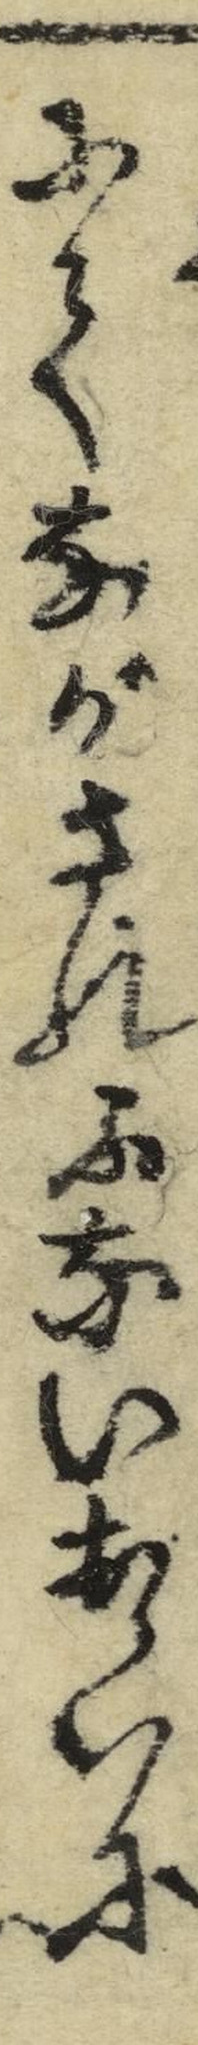にてながされふないおゝいに
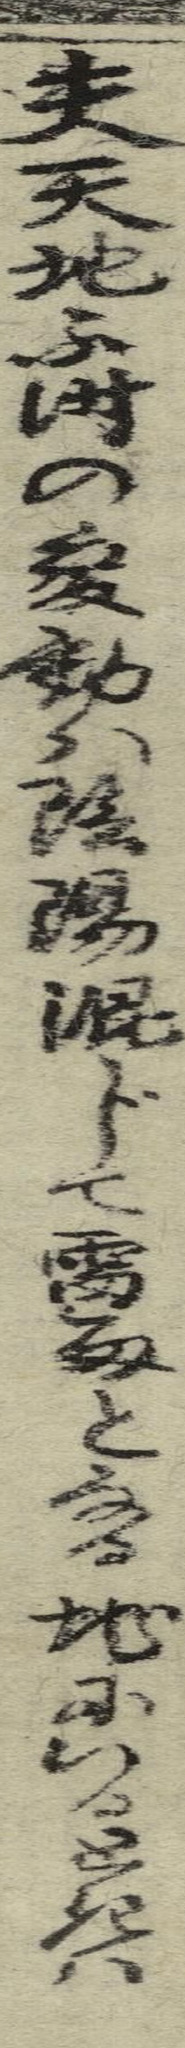夫天地ふ時の震動は陰陽混じて雷雨となる地にいるときは
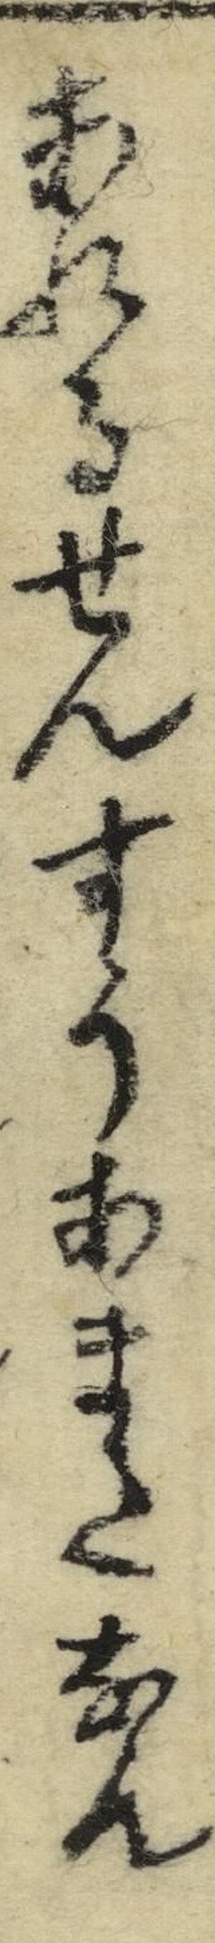おれるせんすうあまたなん
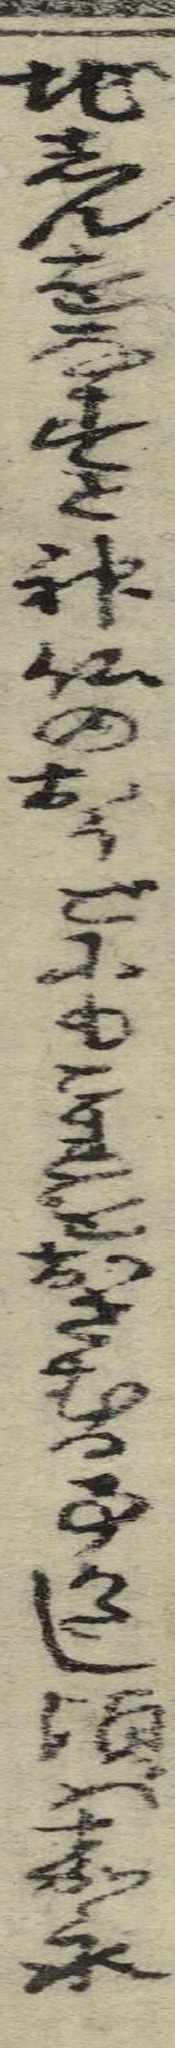地震をなすこと神仏のおかごにもこれをおさむる事かたし頃は嘉永
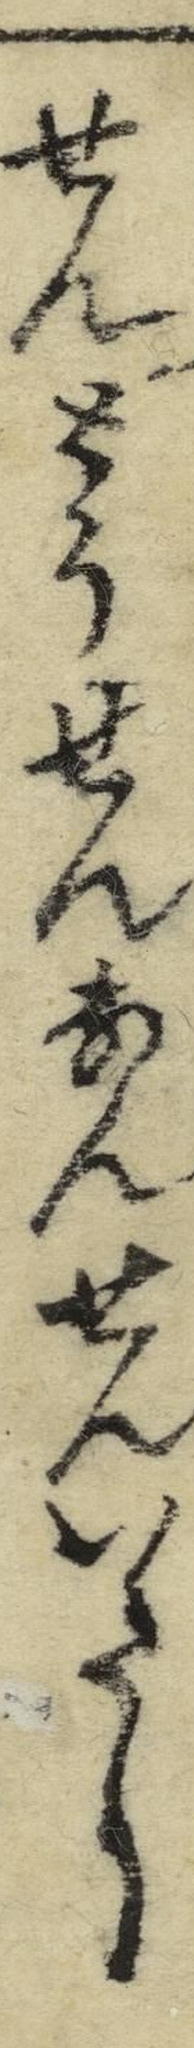せんとうせんなんせんいたし
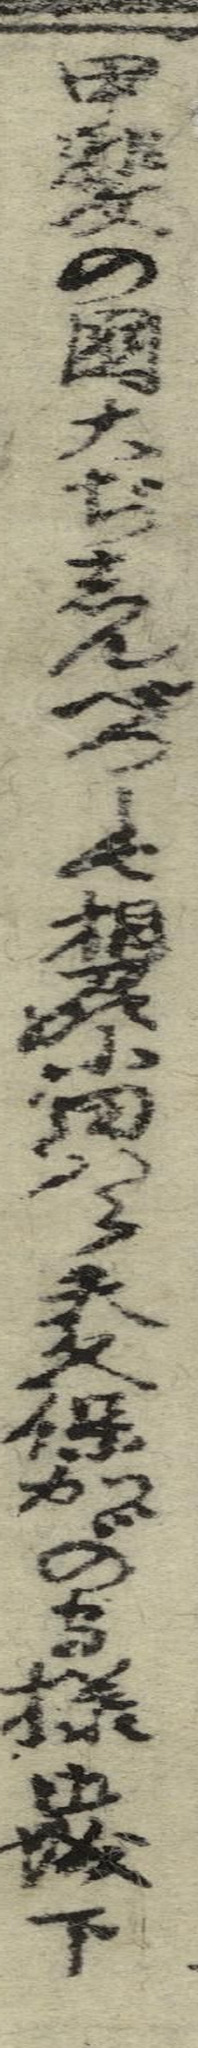甲斐の国大ぢしんべつして相州小田はら大久保かゞの守様御城下
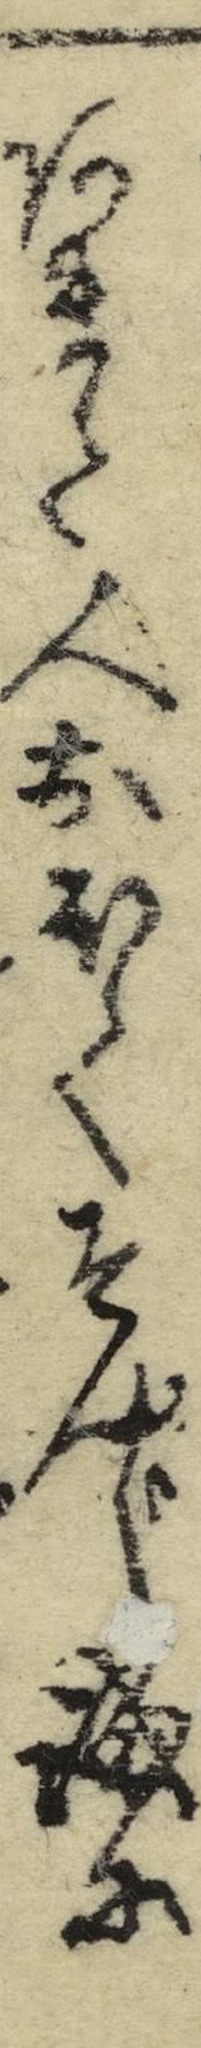あれて人人おほくそんじ誠に
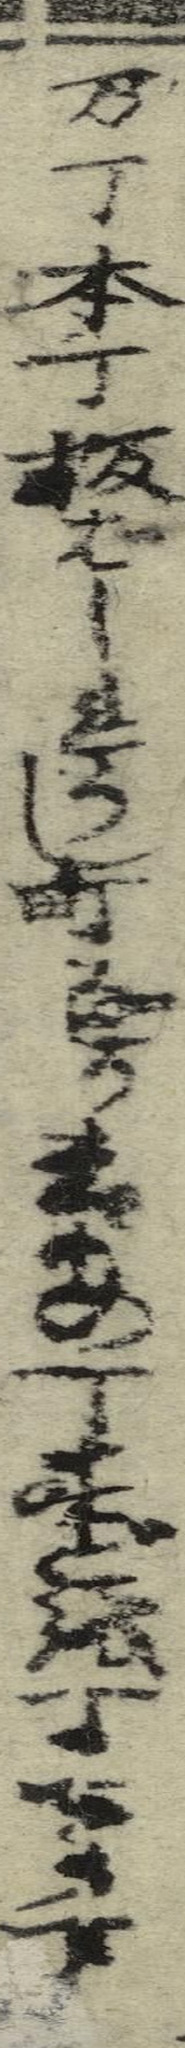万丁本丁板ばしれうし町通り青もの丁すどを町なら丁
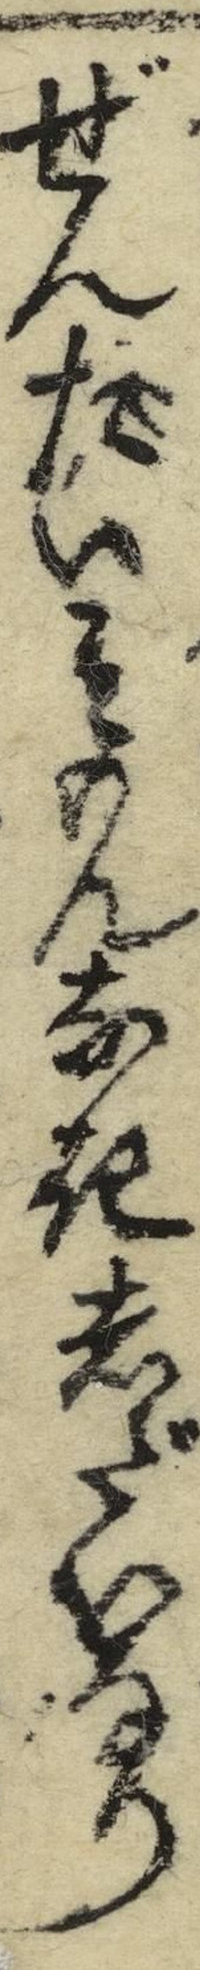ぜんたいみもんなきしだいなり
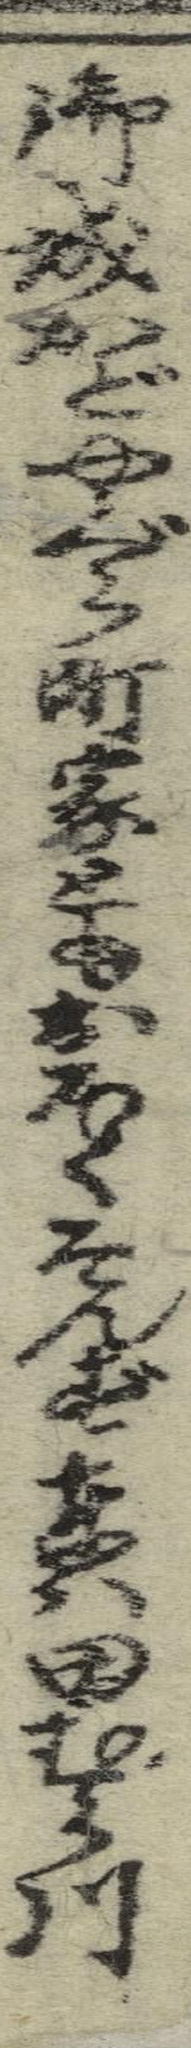御城かどやぐら町家ともおほくそんず東は田むら川
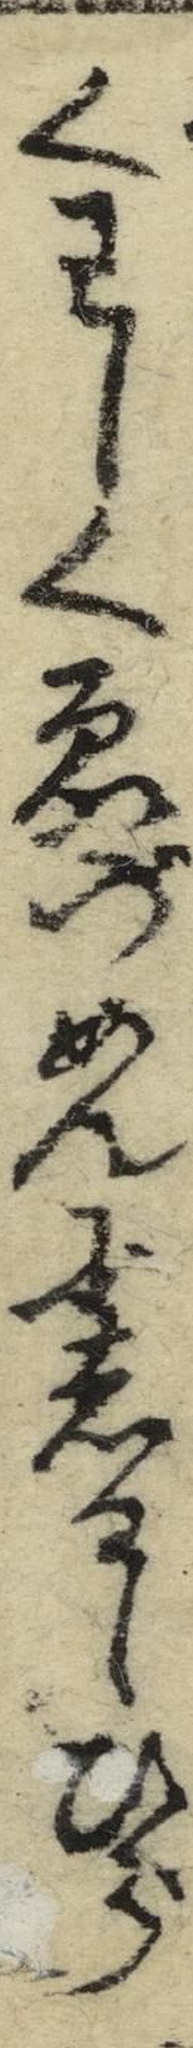くわしくゑづめんにしるしひら
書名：伊豆下田・小田原・箱根　大地震之圖
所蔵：東京大学地震研究所図書室 Earthquake Research Institute Library, The University of Tokyo, JAPAN
